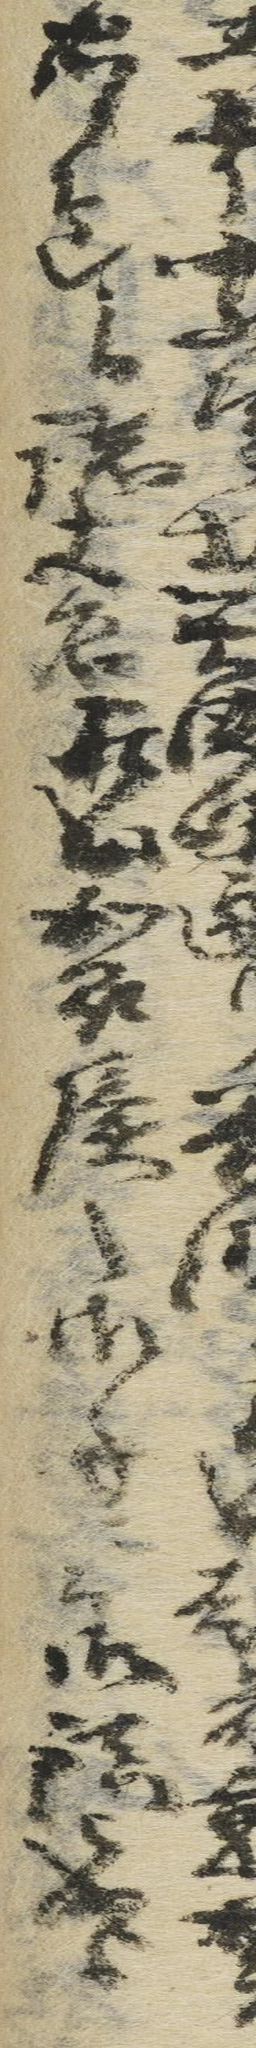右迄江諸大名罷出加州侯之御手二而御請被成候

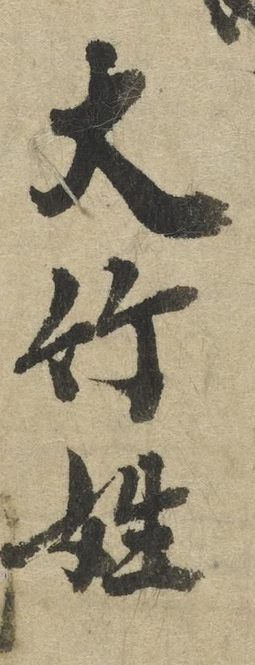大竹姓
